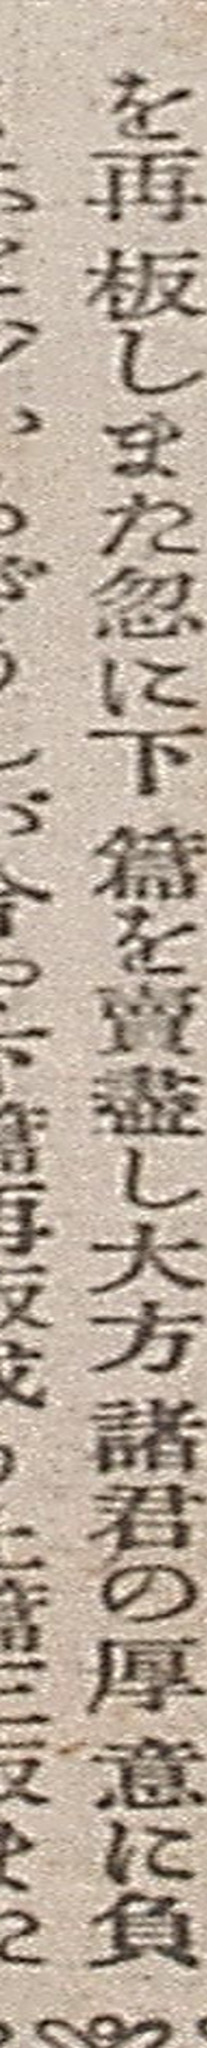を再版しまた忽に下編を売盡し大方諸君の厚意に負
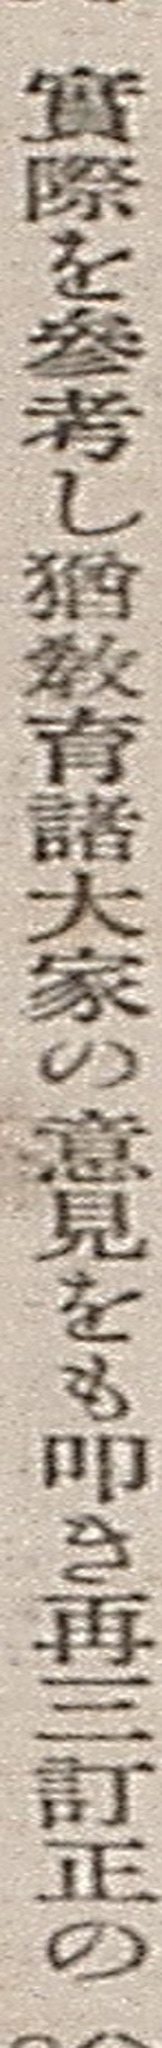実際を参考し猶教育諸大家の意見をも叩き再三訂正の
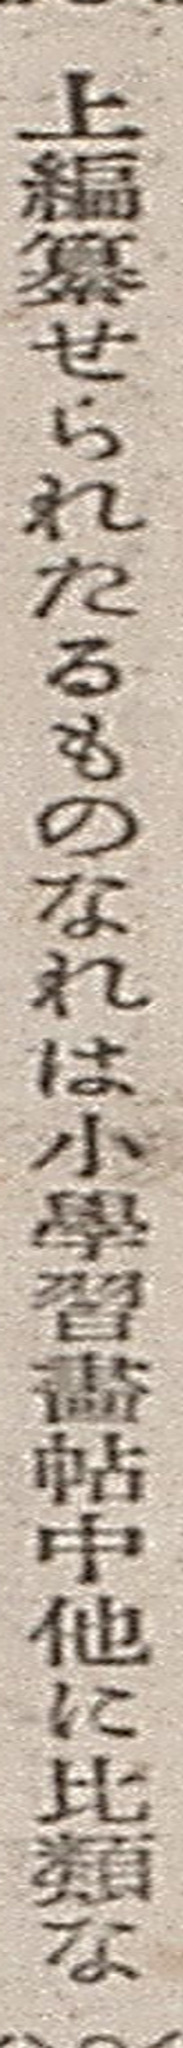上編纂せられたるものなれは小学習畫帖中他に比類な
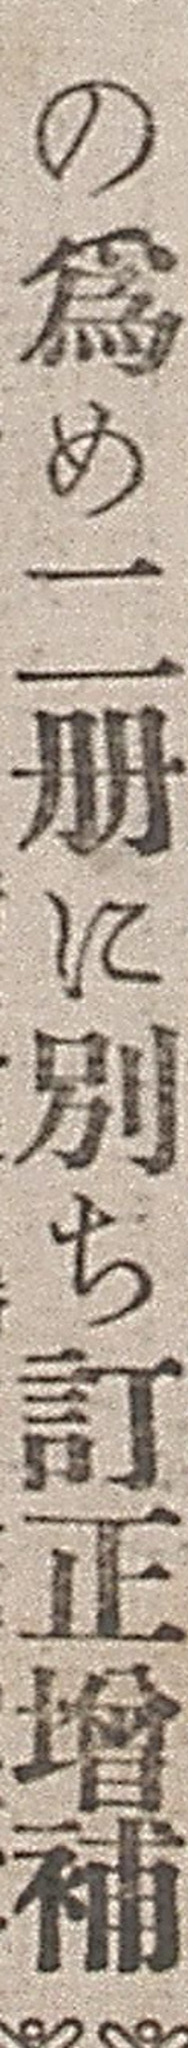の為め二冊に別ち訂正増補
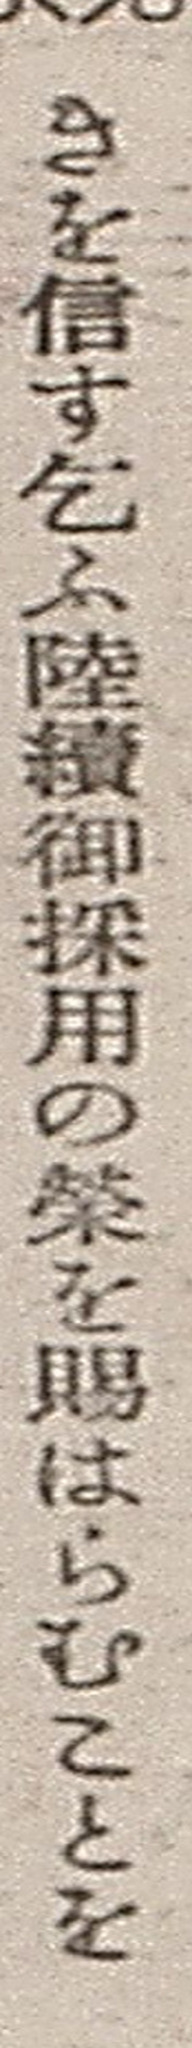きを信す乞ふ陸続御採用の栄を賜はらむことを
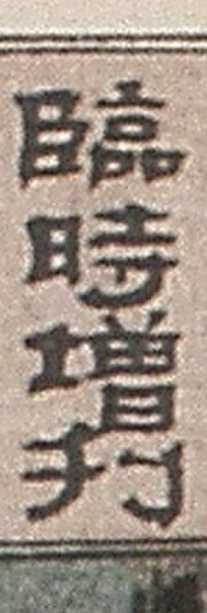臨時増刊
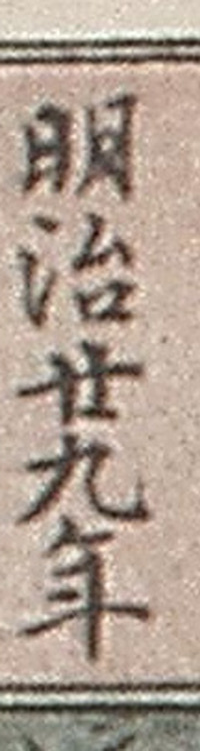明治廿九年
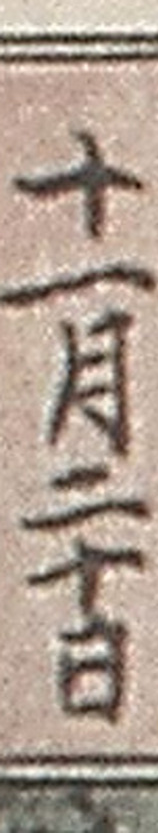十一月二十日
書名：風俗畫報臨時増刊第百二十六號　洪水被害録（中）
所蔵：東京大学地震研究所図書室 Earthquake Research Institute Library, The University of Tokyo, JAPAN
